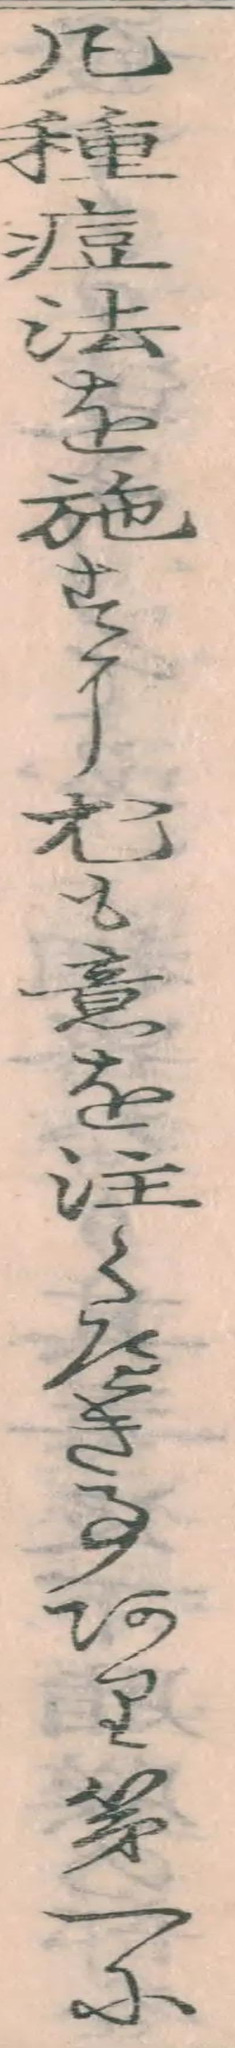凡種痘法を施すに尤も意を注くべき事あり第一に
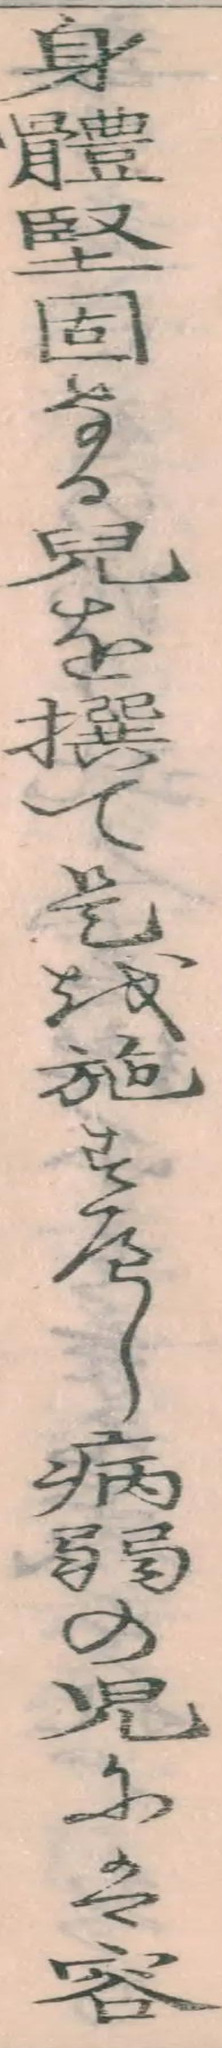身體堅固なる兒を撰て是を施すべし病弱の児には容
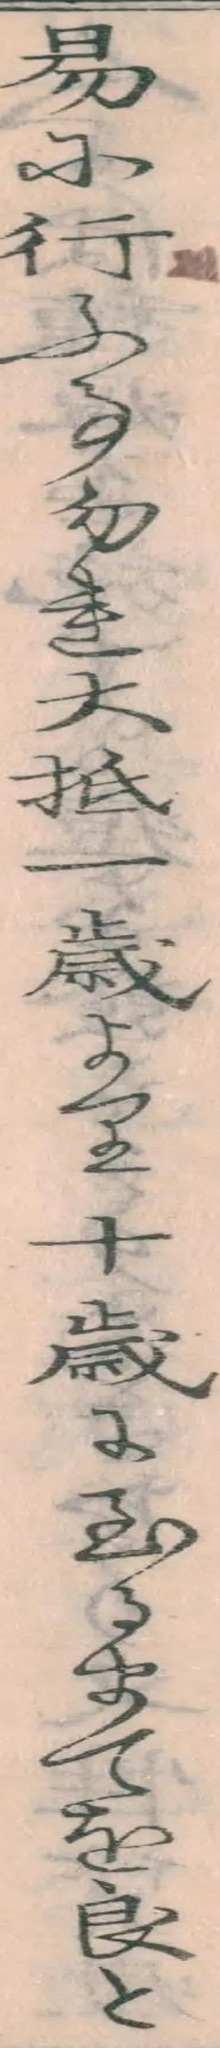易に行ふる勿れ大抵一歳より十歳に至るまてを良と
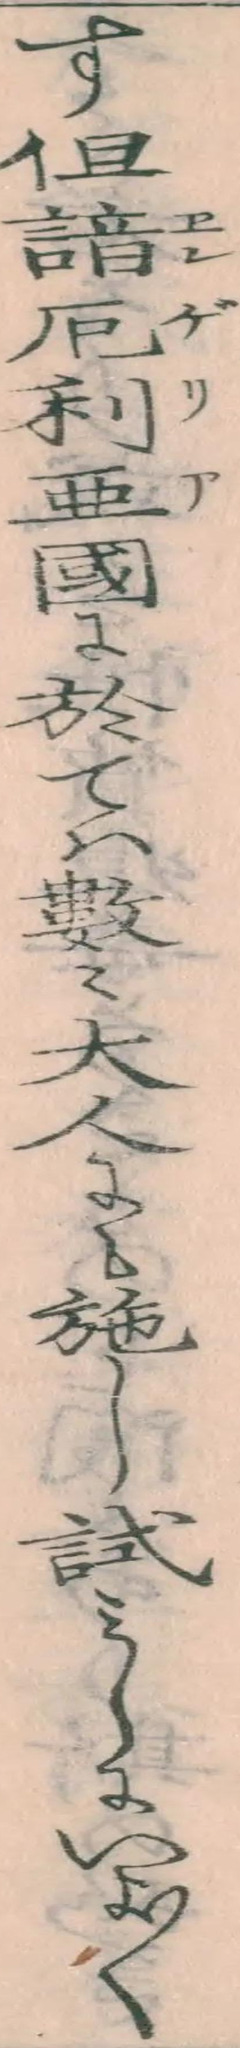す但諳厄利益亜國に於ては數々大人にも施し試みしにいよ〳〵
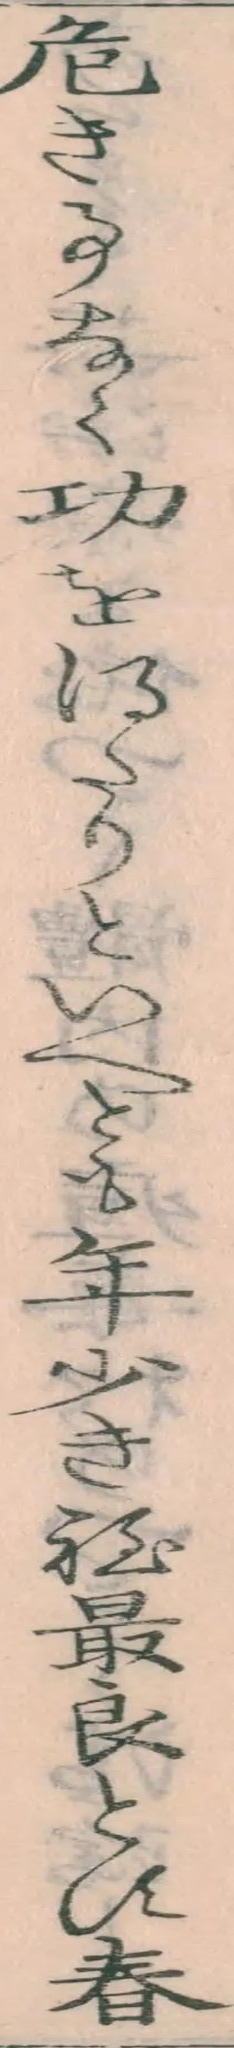危き事なく功を得たりといへとも年少き程最良と春
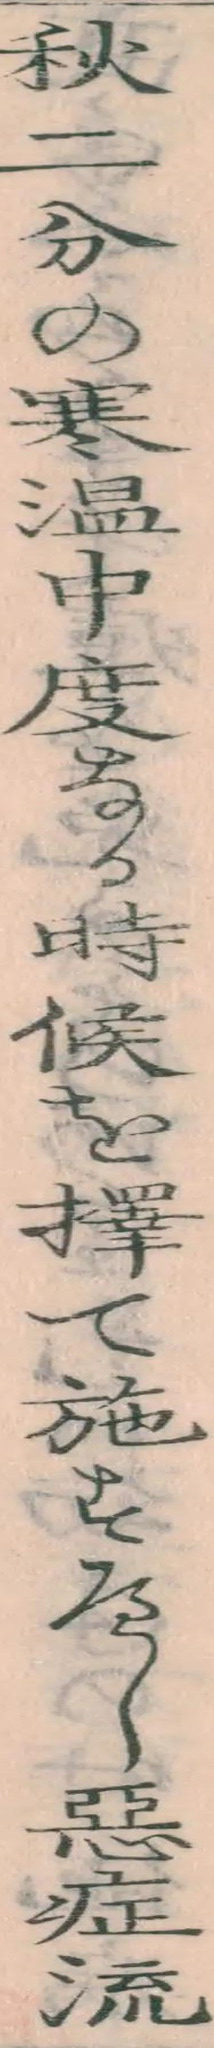秋二分の寒温中度なる時候を擇て施すべし惡症流
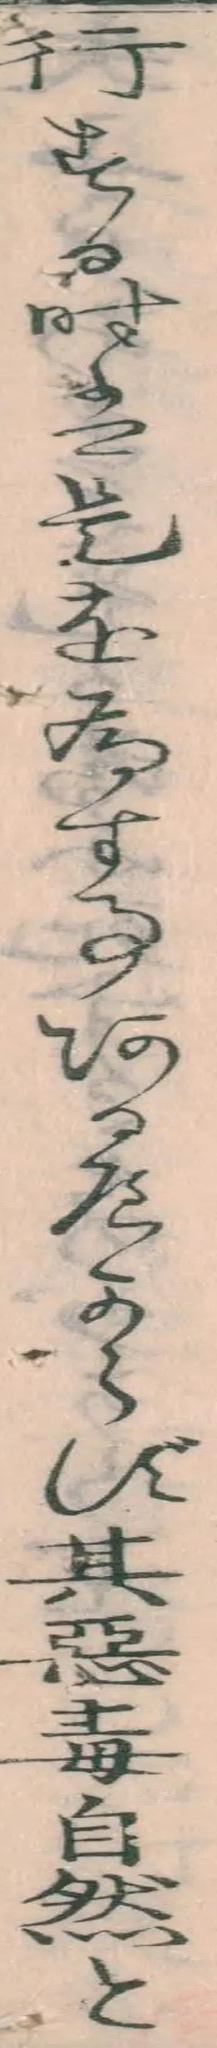行する時は是を為す事あるへからず其惡毒自然と
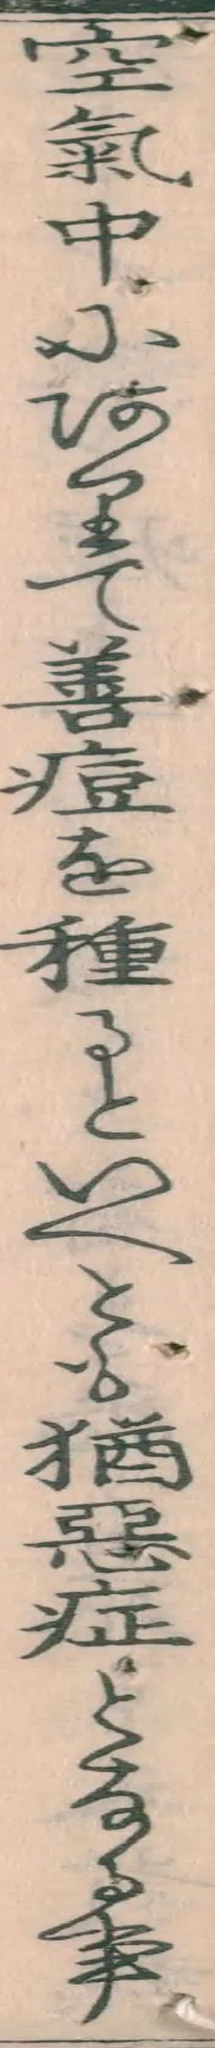空氣中にありて善痘を種るといへとも猶惡症となる事
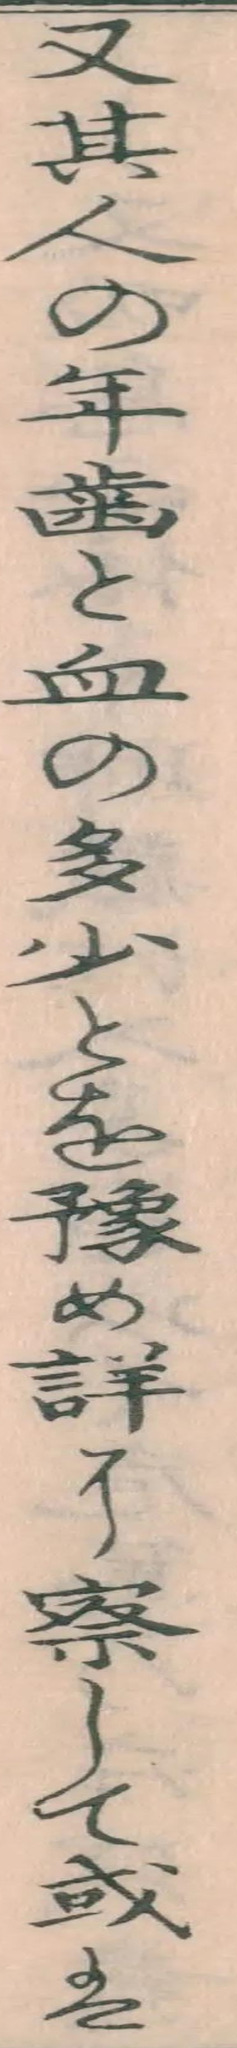又其人の年歯と血の多少とを豫め詳に察して或は
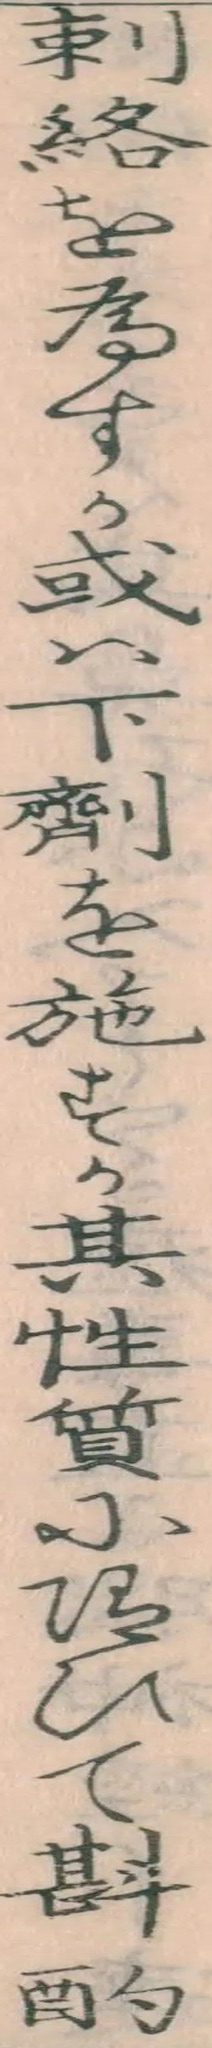刺絡を為すか或は下劑を施すか其性質に隨ひて斟酌
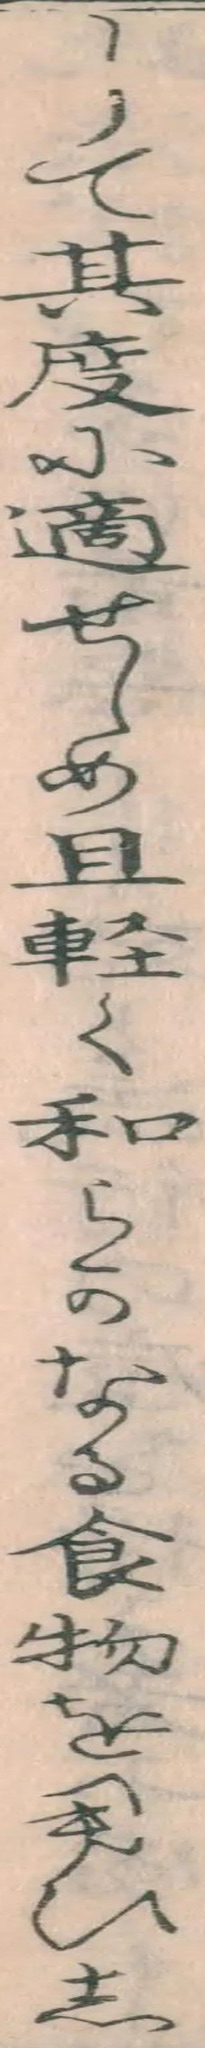して其度に適せしめ且軽く和らかなる食物を用ひし
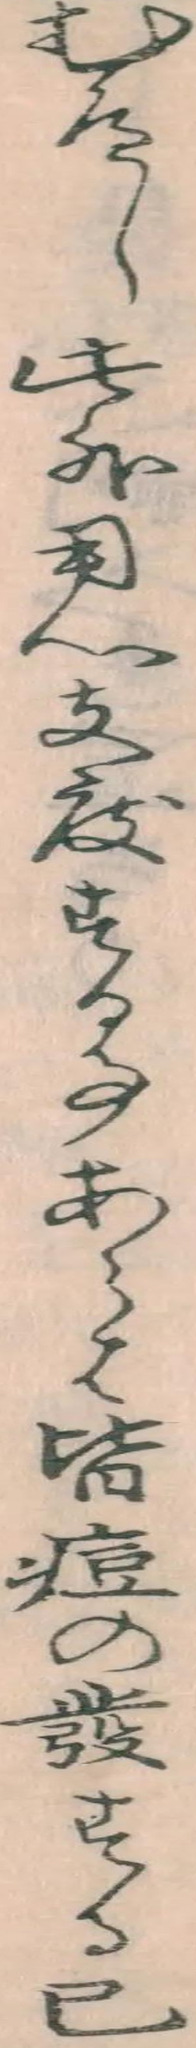むべし此外用心支柱度する事あらは皆痘の發する己
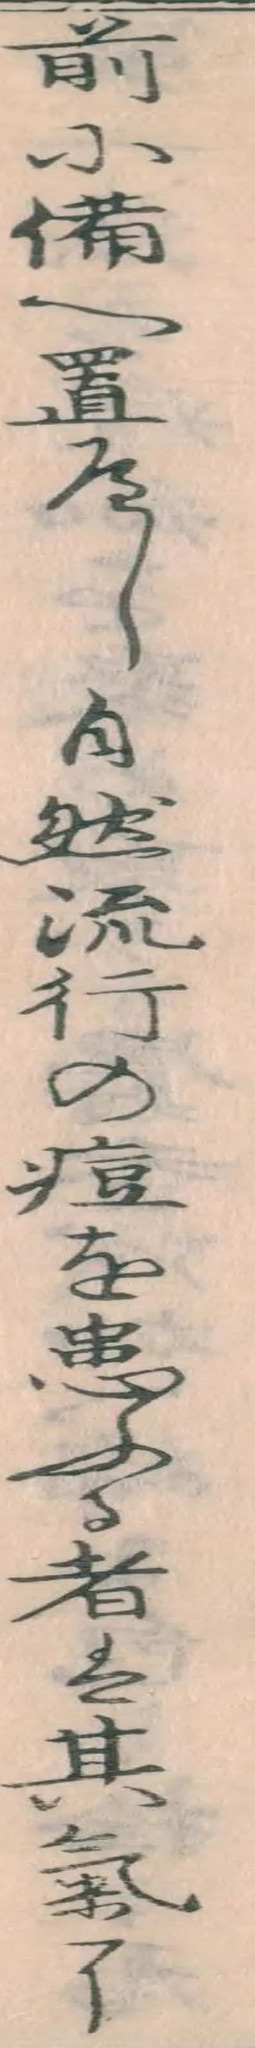前に備へ置べし自然流行の痘を患ふる者は其氣に
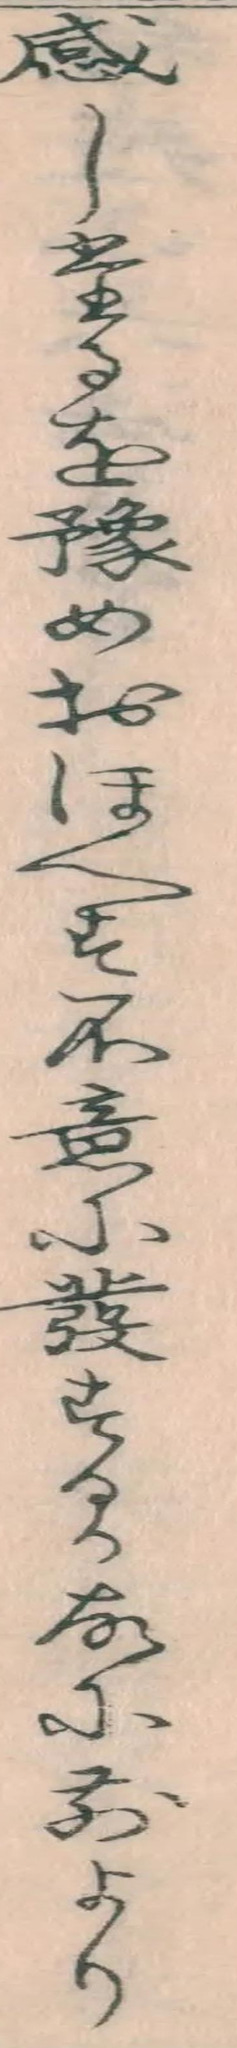感したるを豫めおほへす不意に發するか故に前より
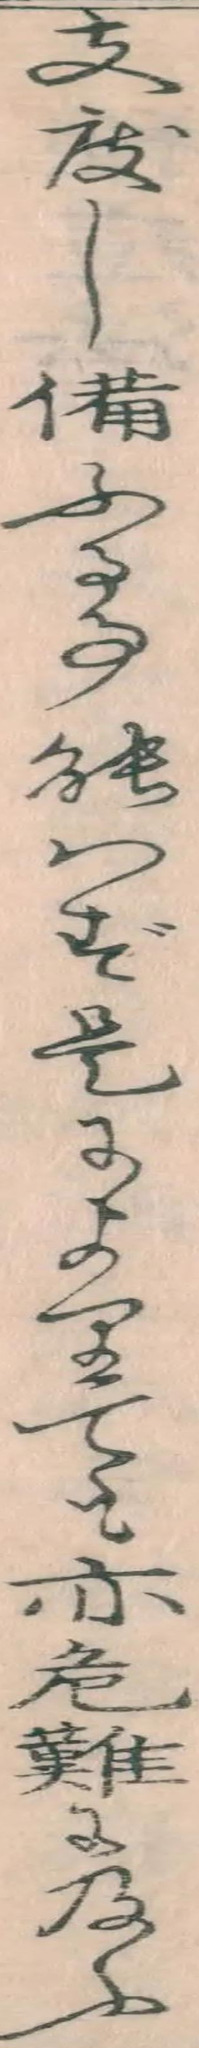支度し備ふる事能はず是によりても亦危難に及ふ
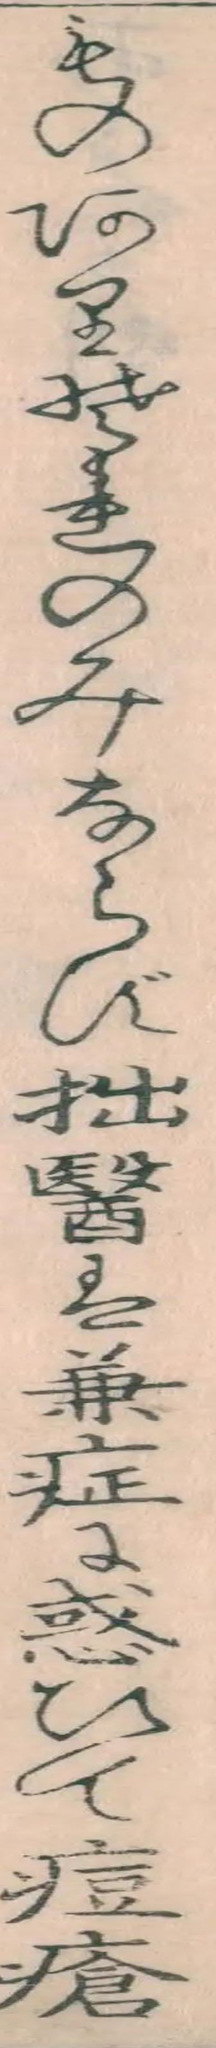ものありそれのみならず拙醫は兼症に惑ひて痘瘡
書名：種痘新編
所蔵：国立国会図書館 National Diet Library, JAPAN
